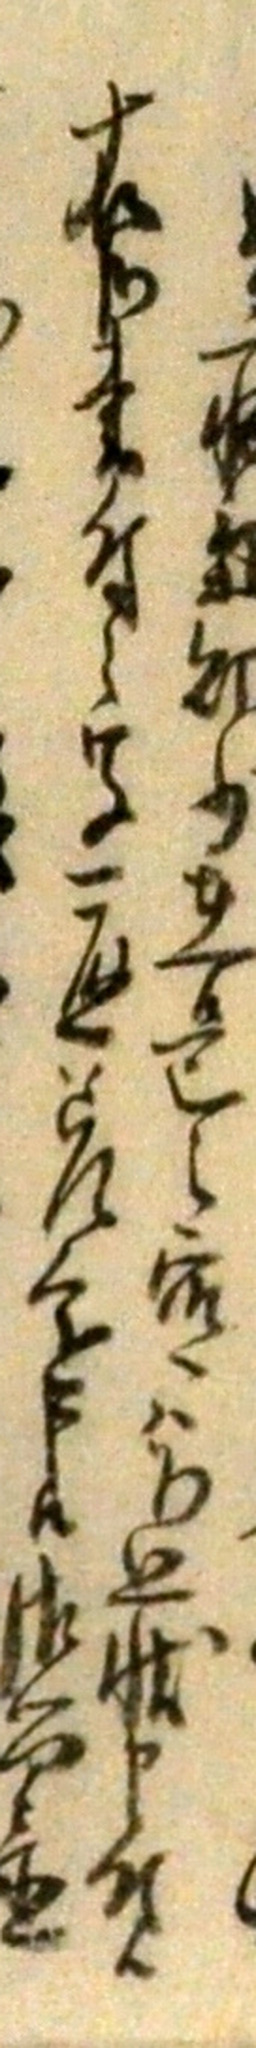右御書付之写一通差進申候御留置
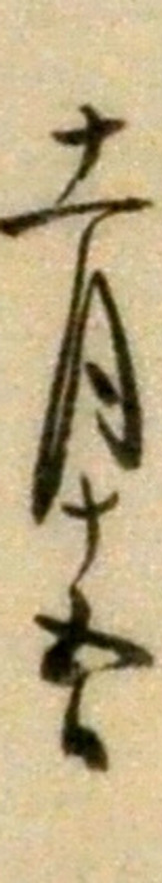十一月十五日
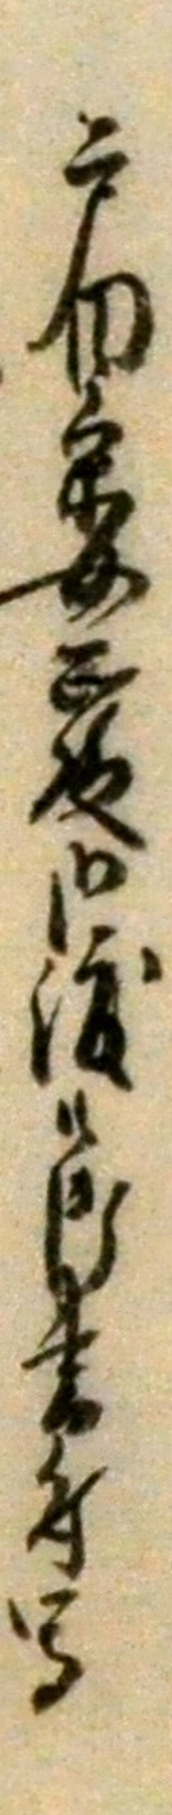戸田采女正殿御渡候御書付写
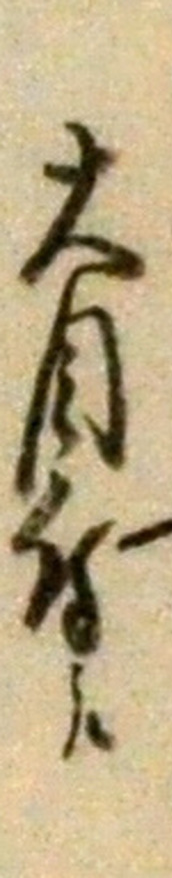大目付え
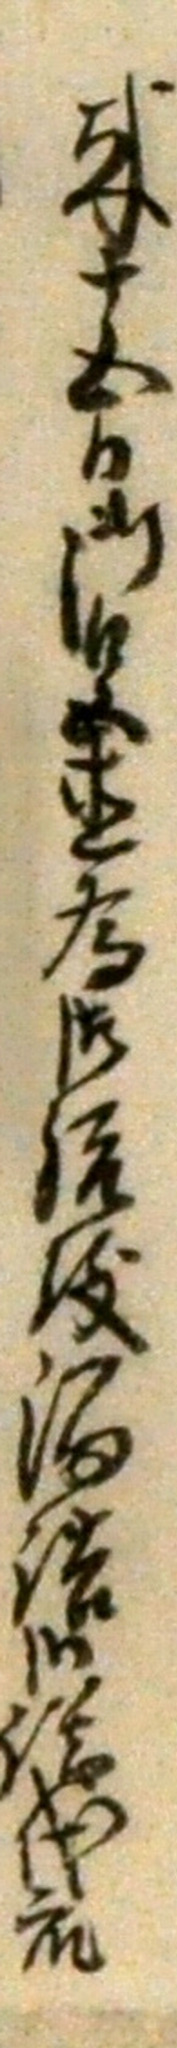来十五日御色直為御祝儀溜詰御譜代衆
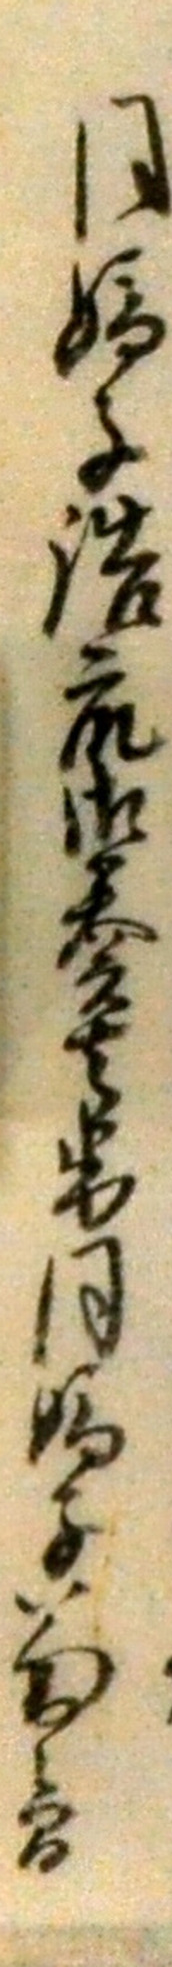同嫡子詰衆御奏者番同嫡子菊之間

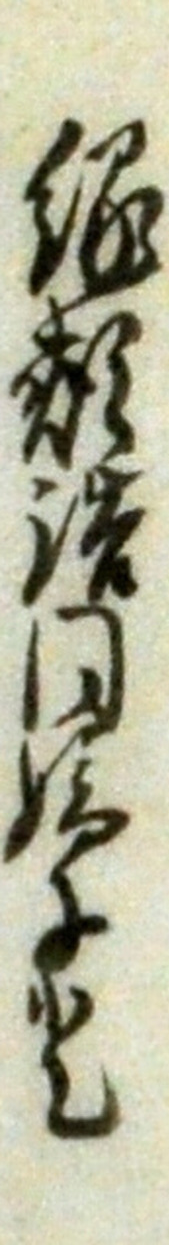縁頬詰同嫡子登
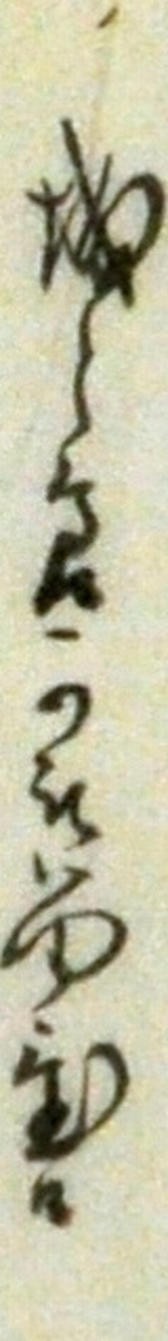城之節可被留置候
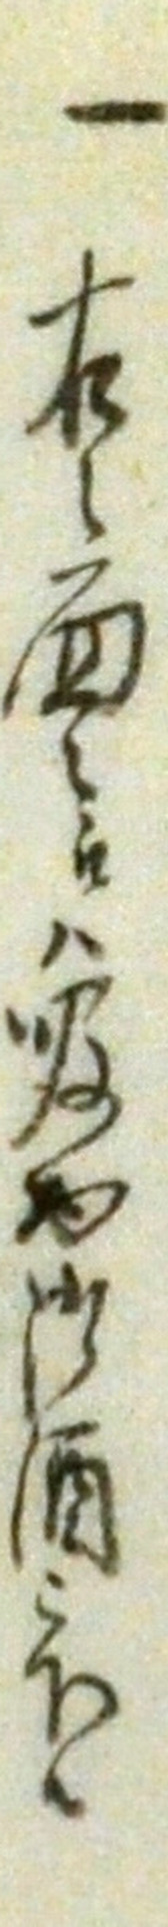一右之面々えは吸物御酒被下候
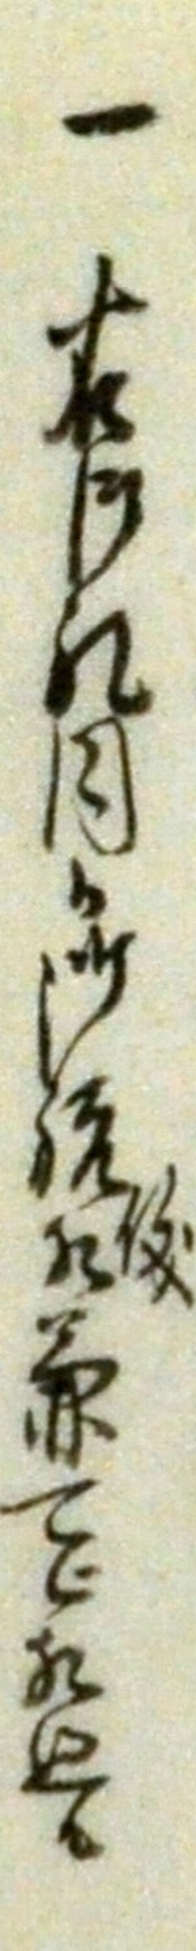一右御礼同日御祝儀相兼可被相廻候
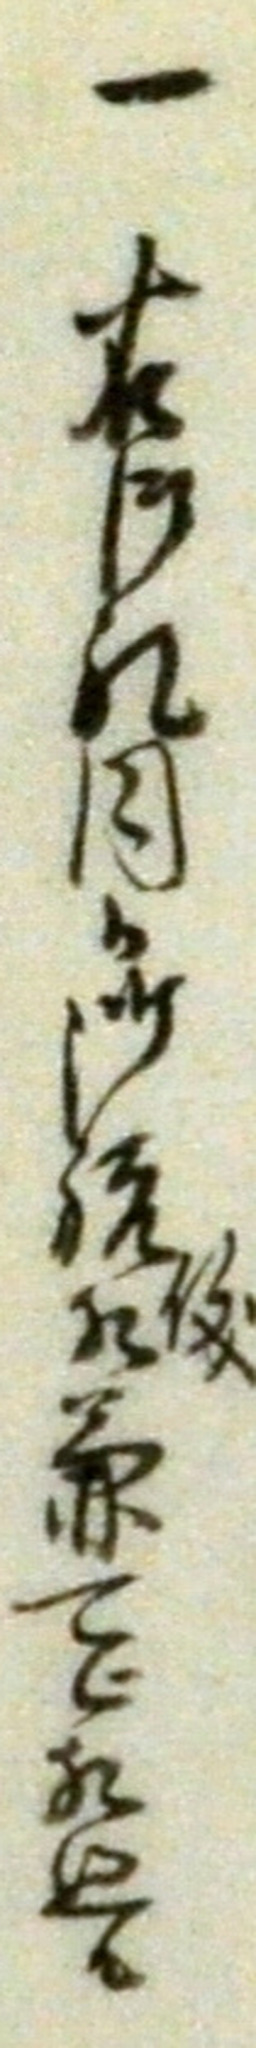一右御礼同日御祝儀相兼可被相廻候
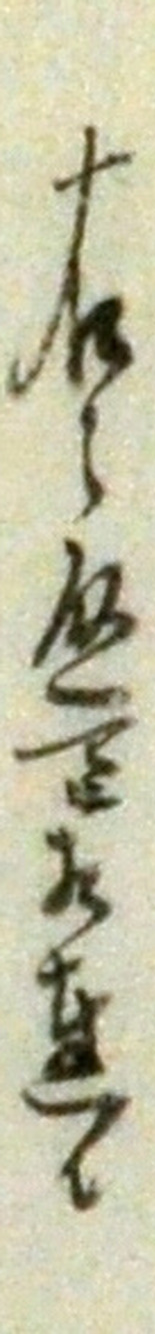右之通可被相達候
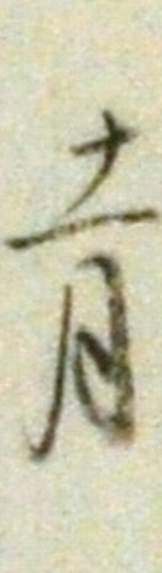十一月
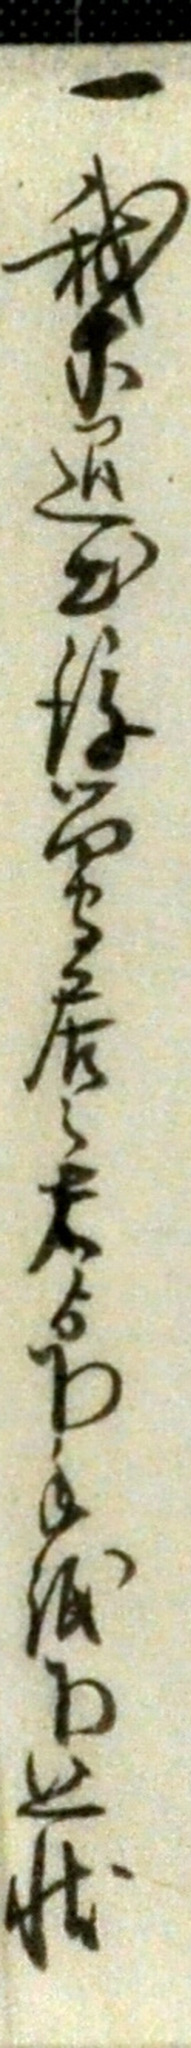一我等退出後留守居之者ゟ下手紙下廻状
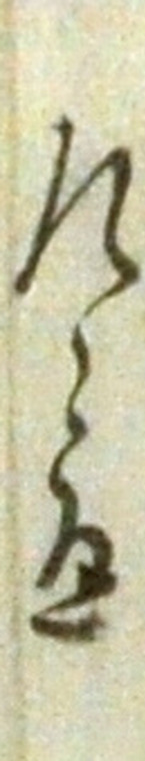左之通
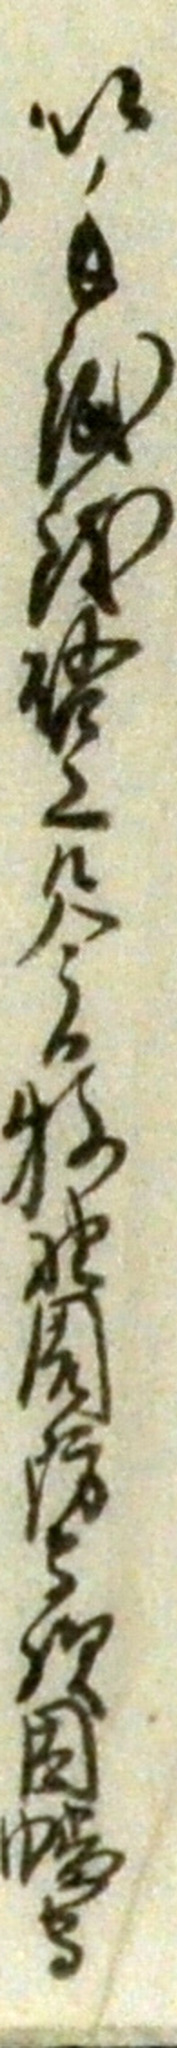以手紙致啓上候今日牧野周防守様因幡守
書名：若君様御色直御祝儀ノ節ノ留
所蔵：伊那市立高遠町図書館・合同会社AMANE
